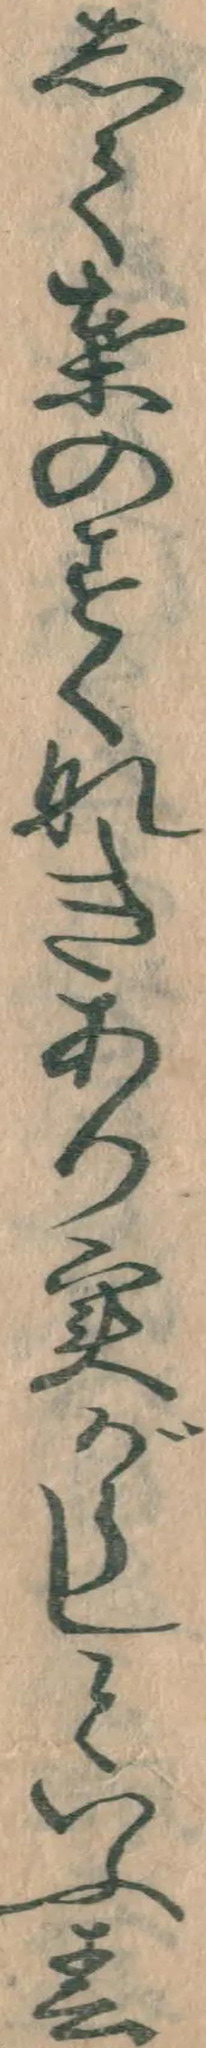して葉のすくなきあり実がらしといふ春
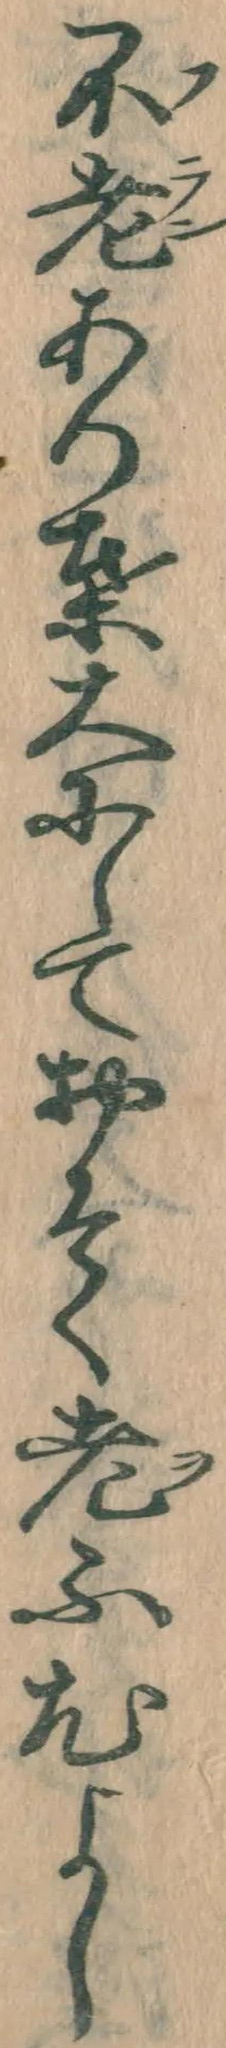不老あり葉大にしておそく老ふ尤よし

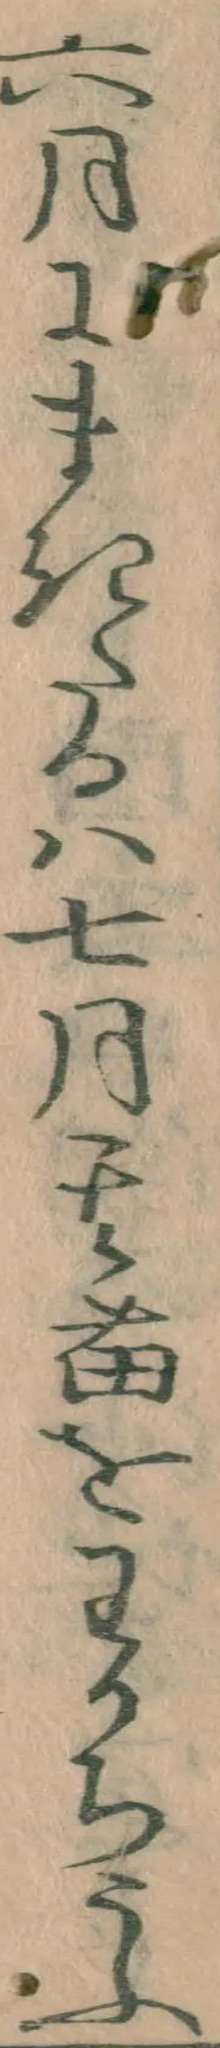六月にまきたるは七月其苗をわかちうふ
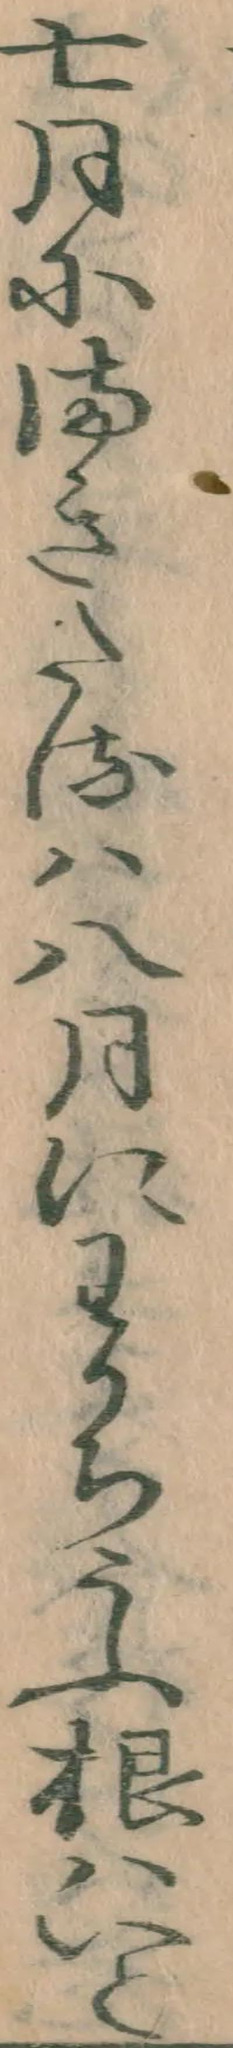七月にまきたるは八月にわかちうふ根はいと
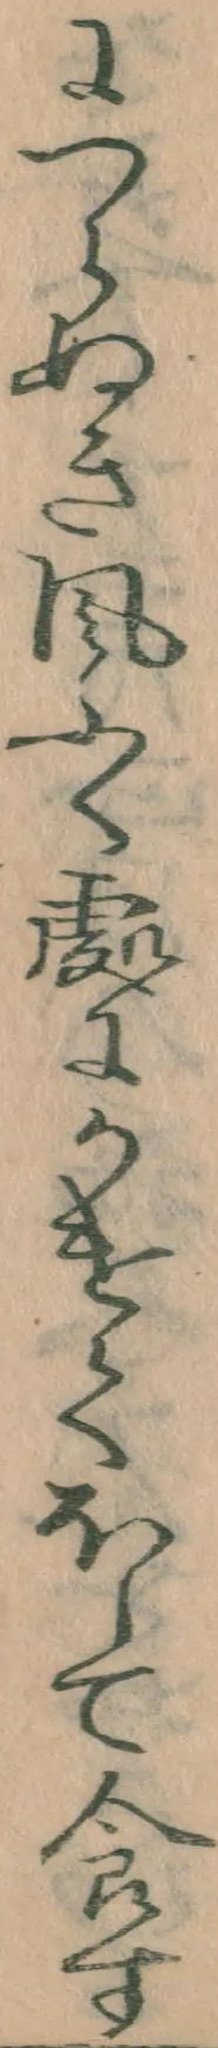につらぬき風ふく処にかけてほして食す
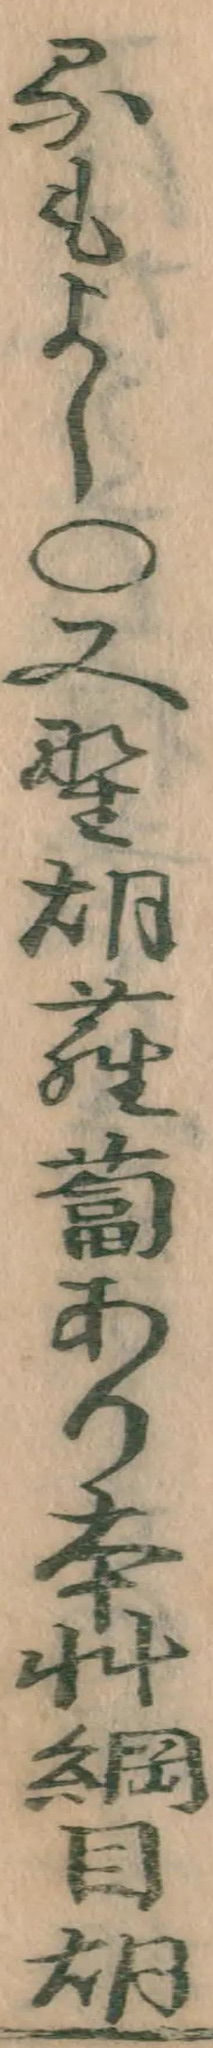るもよし〇又野胡蘿蔔あり本艸綱目胡
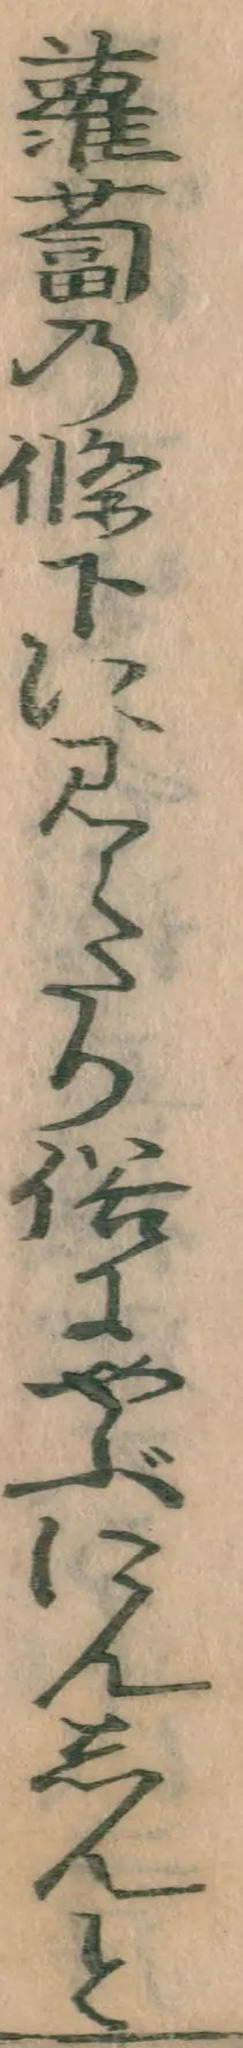蘿蔔の条下に見えたり俗にやぶにんしんと
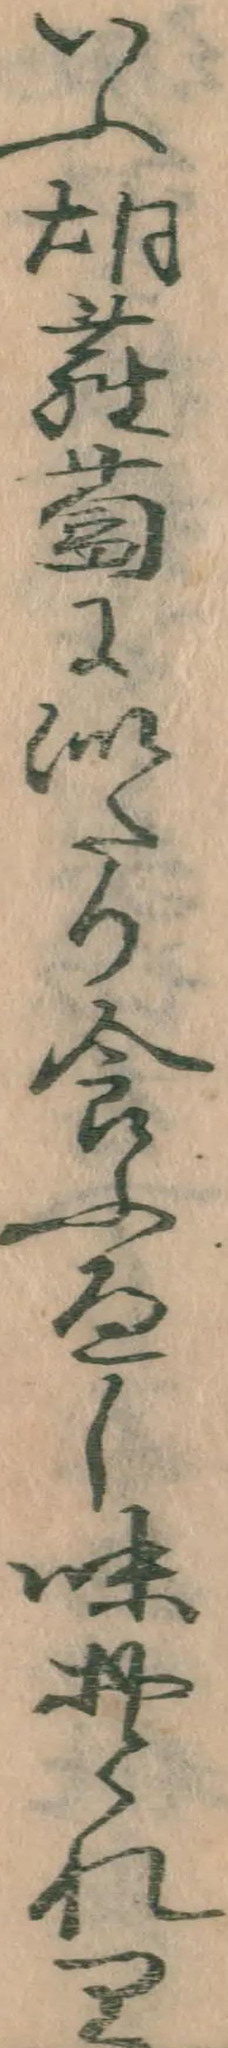うふ胡蘿蔔に似たり食ふへし味おとれり
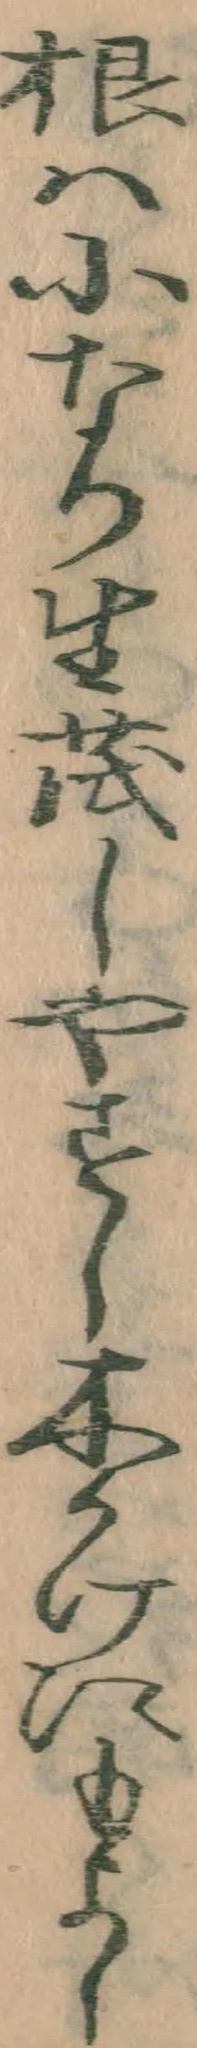根は小なり生茂しやすし木かけにもよし
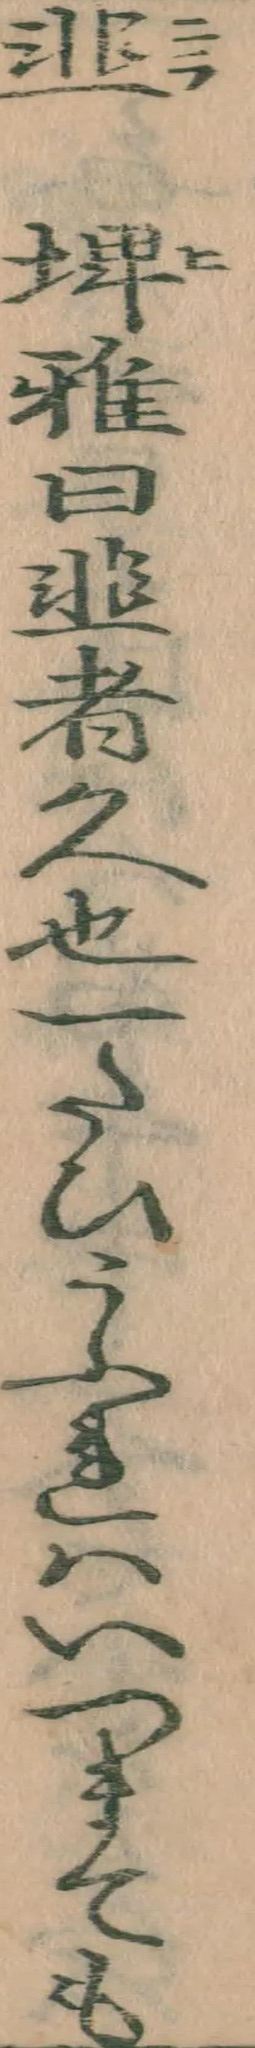韮埤雅曰韮者久也一たひうふれはいつまても
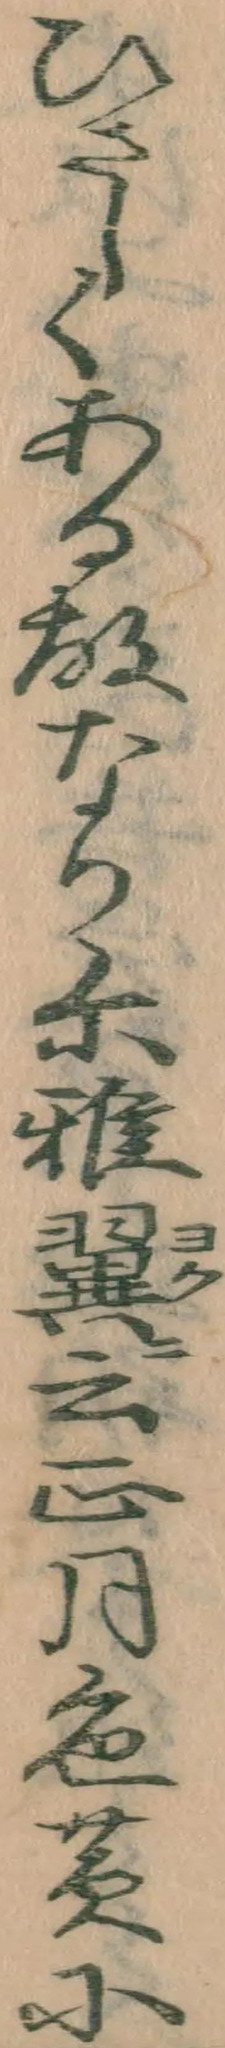ひさしくある故なり爾雅翼云正月色黄に
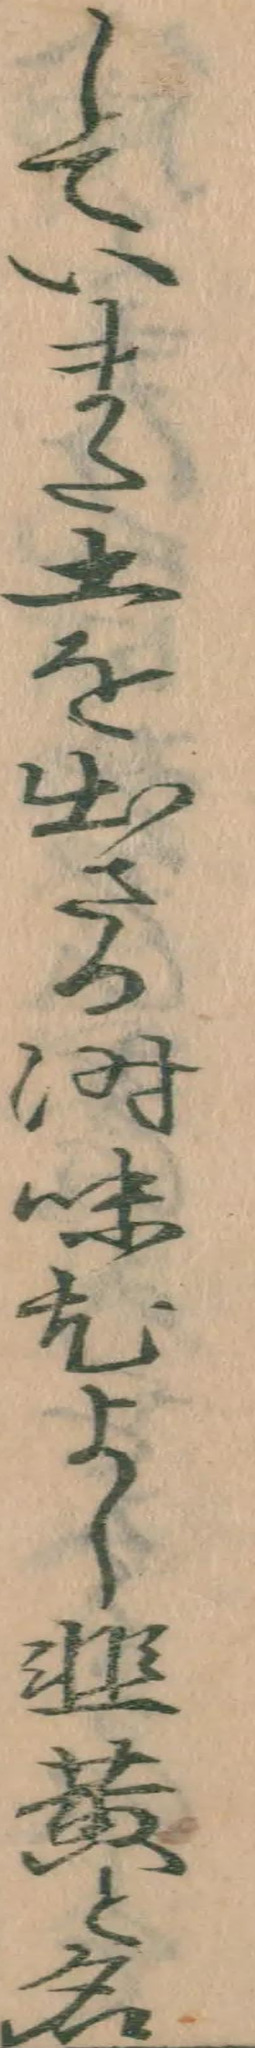していまた土を出さる時味尤よし韮黄と名
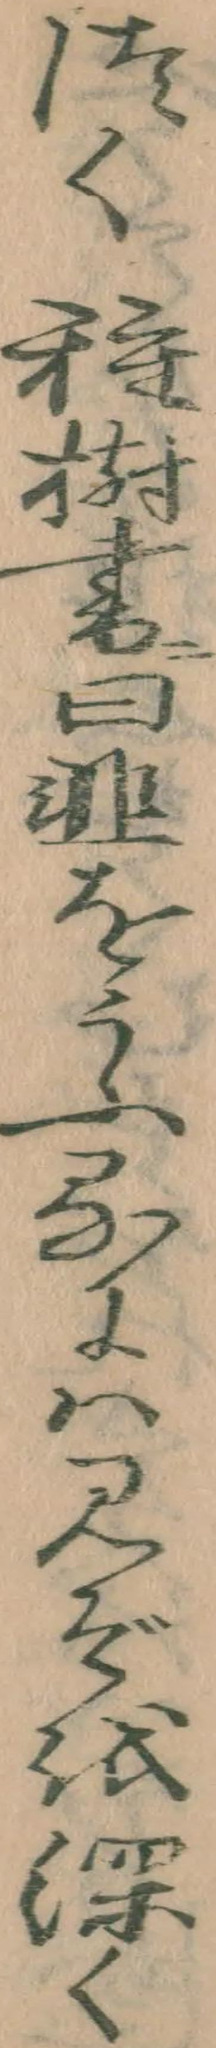つく種樹書曰韮をうふるにはみぞを深く
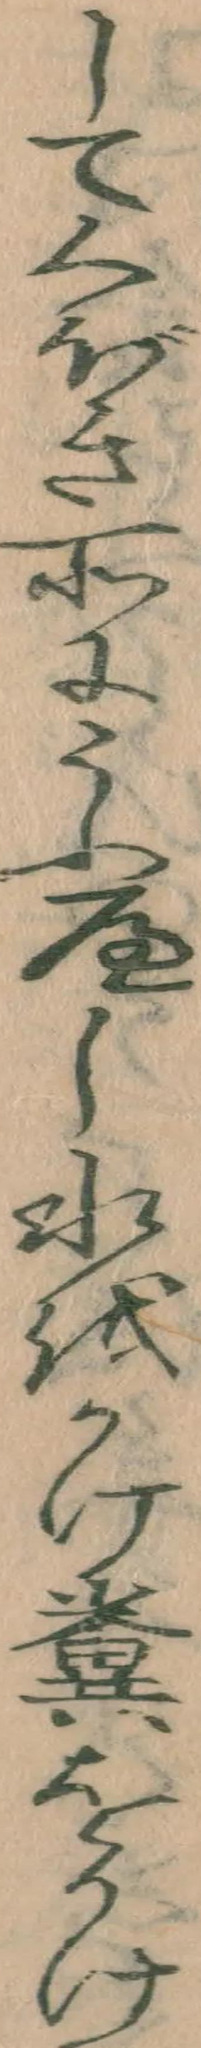してくぼき所にうふへし水をかけ糞をかけ
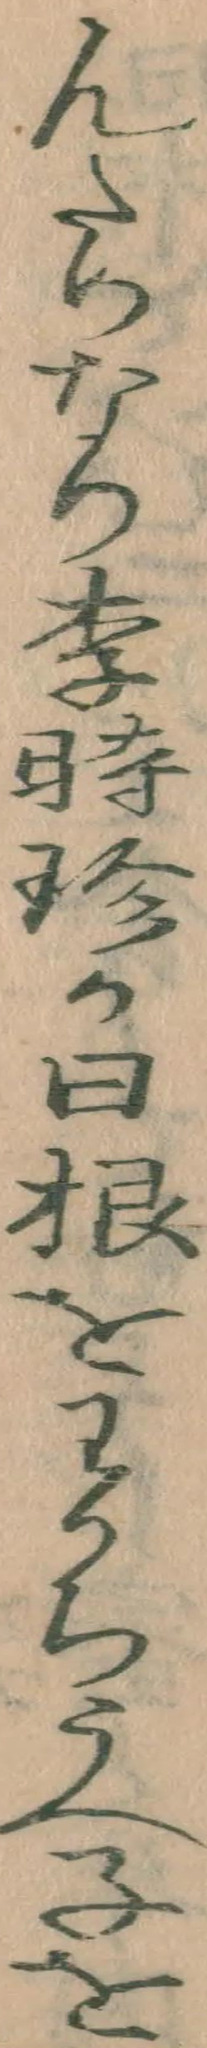んためなり李時珍か曰根をわかちうへ子を
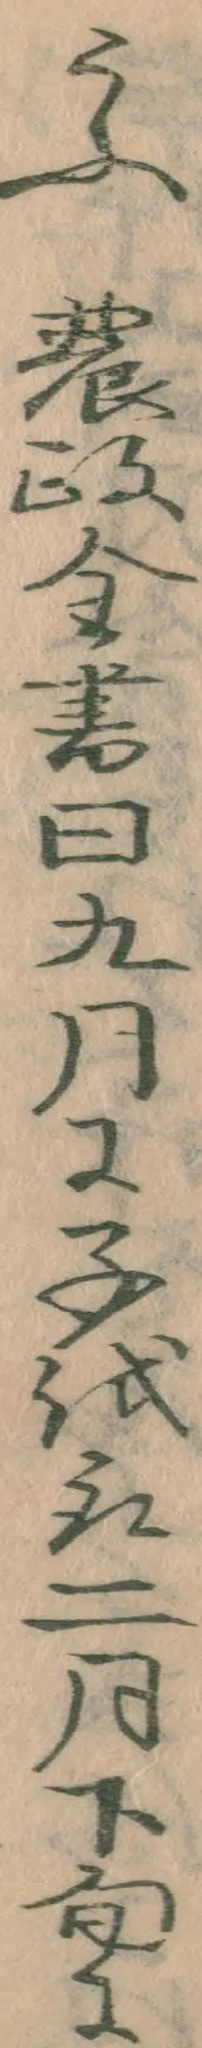うふ農政全書曰九月に子を取二月下旬に
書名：菜譜 3巻
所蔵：国立国会図書館 National Diet Library, JAPAN
